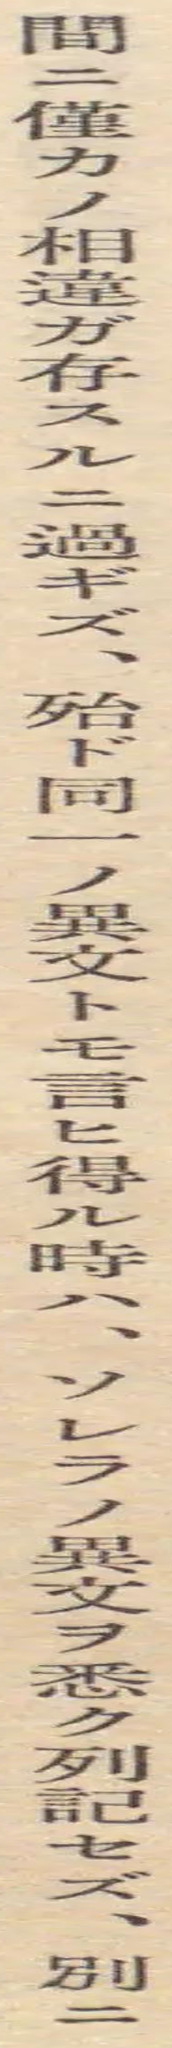間ニ僅力ノ相違ガ存スルニ過ギズ、殆ド同一ノ異文トモ言ヒ得ル時ハ、ソレラノ異文ヲ悉ク列記セズ、別ニ
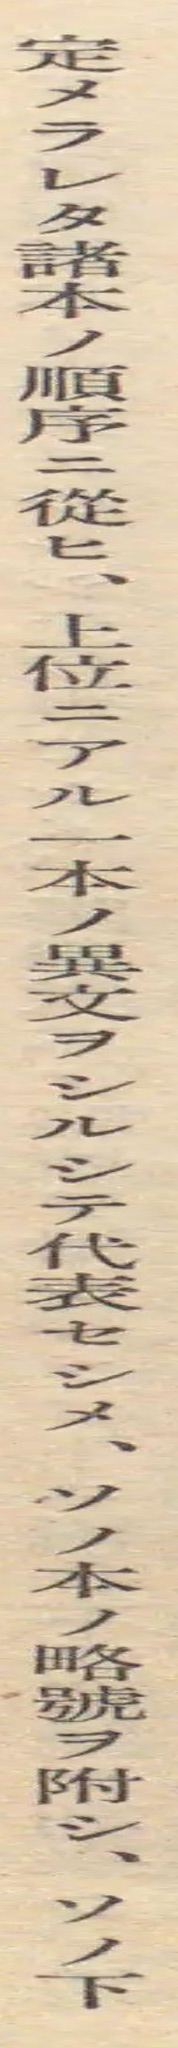定メラレタ諸本ノ順序ニ従ヒ、上位ニアル一本ノ異文ヲシルシテ代表セシメ、ソノ本ノ本ノ略号ヲ附シ、ソノ下
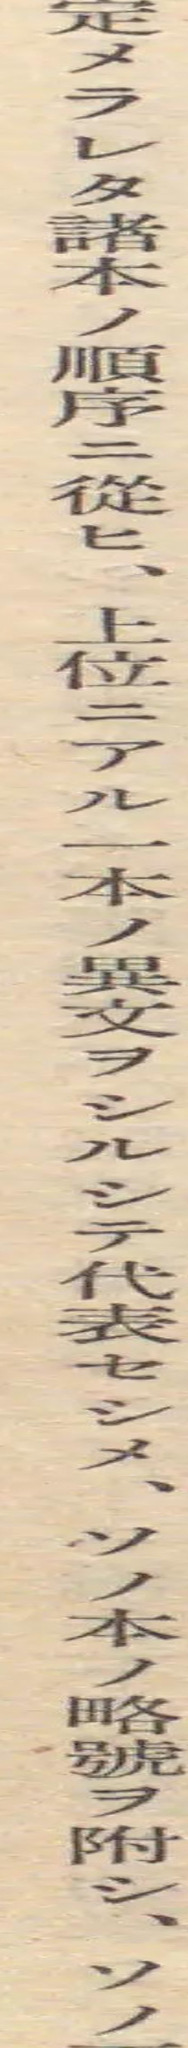定メラレタ諸本ノ順序ニ従ヒ、上位ニアル一本ノ異文ヲシルシテ代表セシメ、ソノ本ノ本ノ略号ヲ附シ、ソノ下
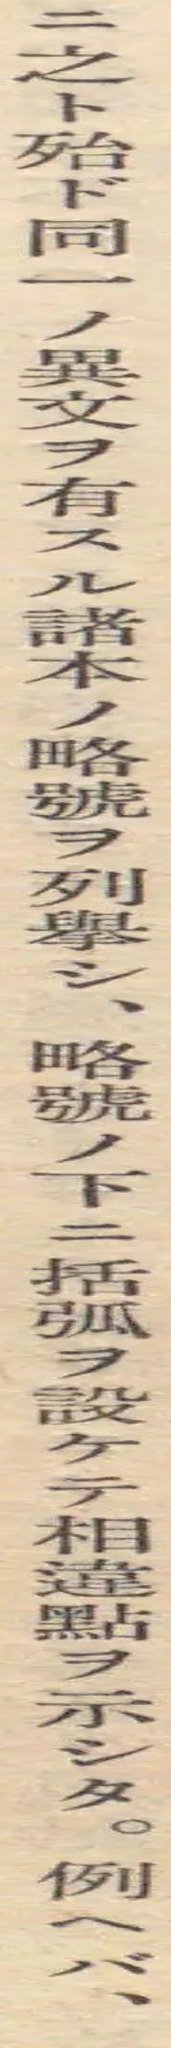ニ之ト殆ド同一ノ異文ヲ有スル諸本ノ略号ヲ列挙シ、略号ノ下ニ括弧ヲ設ケテ相違点ヲ示シタ。例ヘバ
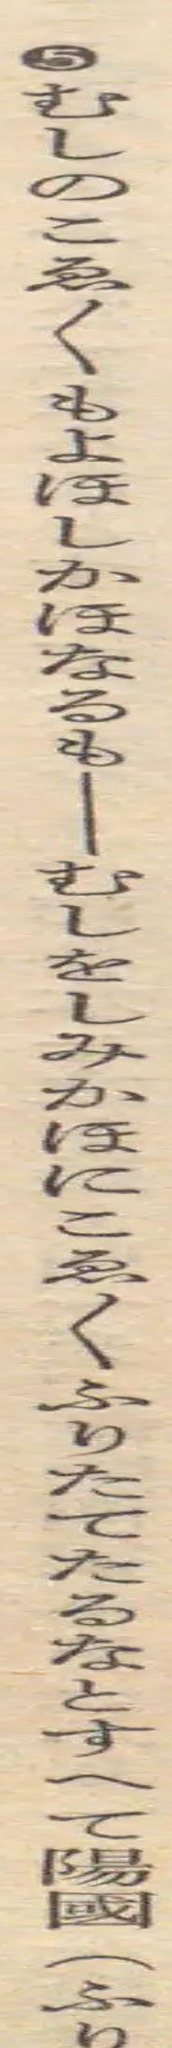❺むしのこゑ〳〵もよほしかほなるも──むしをしみかほにこゑ〳〵ふりたてたるなとすへて陽国(ふり

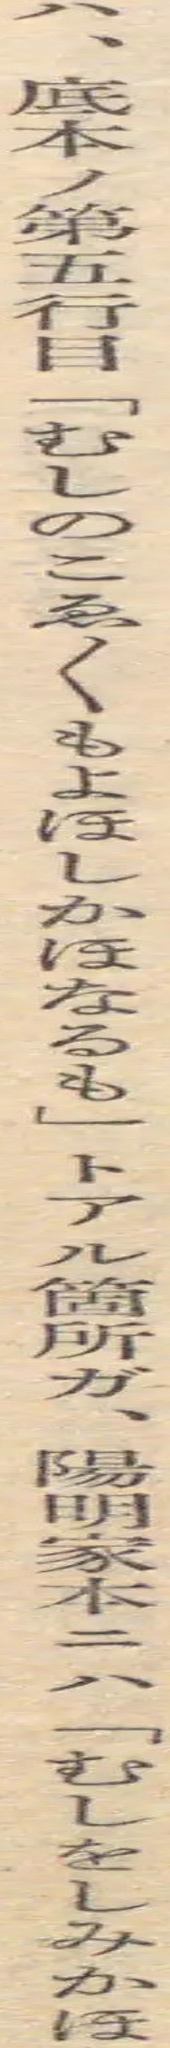ハ、底本ノ第五行目「むしのこゑ〳〵もよほしかほなるも」トアル箇所ガ、陽明家本ニハ「むしをしみかほ
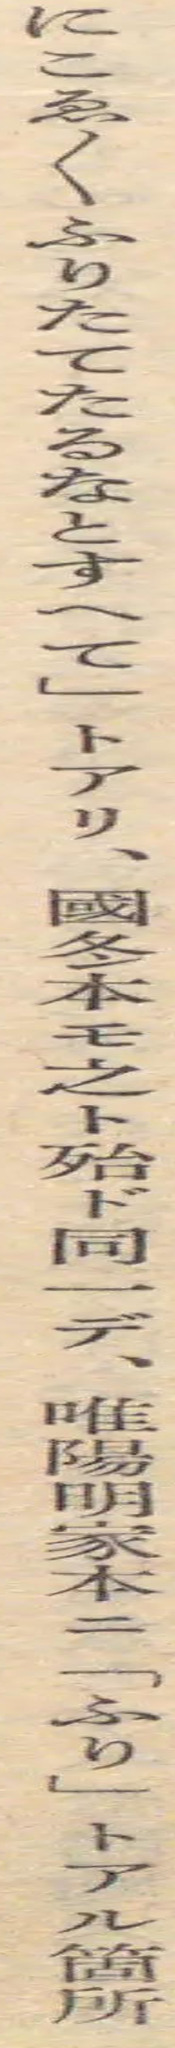にこゑ〳〵ふりたてたるなとすへて」トアリ、国冬本モ之ト殆ド同一デ、唯陽明家本ニ「ふり」トアル箇所
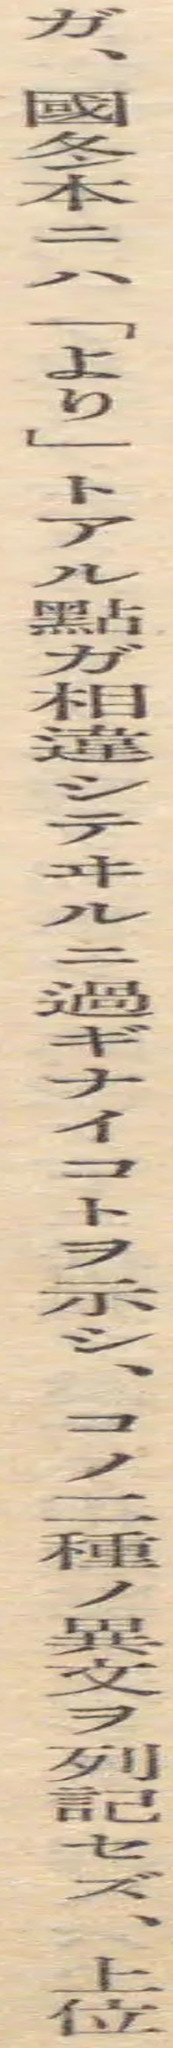ガ、国冬本ニハ「よリ」トアル点ガ相違シテヰルニ過ギナイコトヲ示シ、コノ二種ノ異文ヲ列記セズ、上位
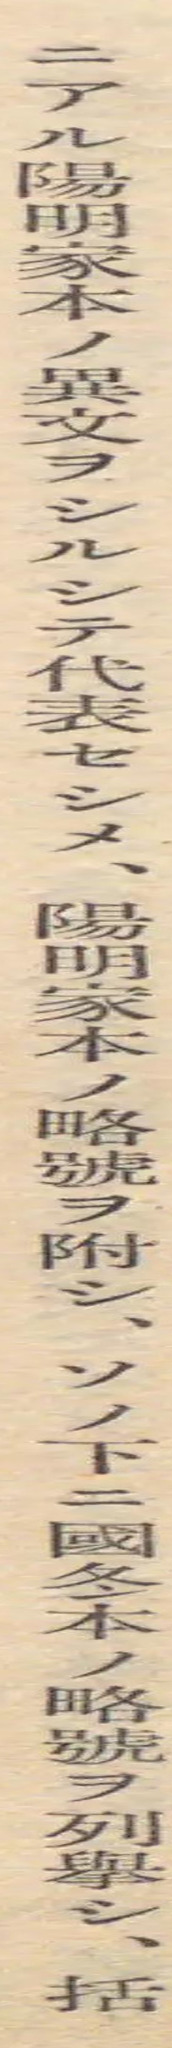ニアル陽明家本ノ異文ヲシルシテ代表セシメ、陽明家本ノ略号ヲ附シ、ソノ下ニ国冬本ノ略号ヲ列挙シ、括
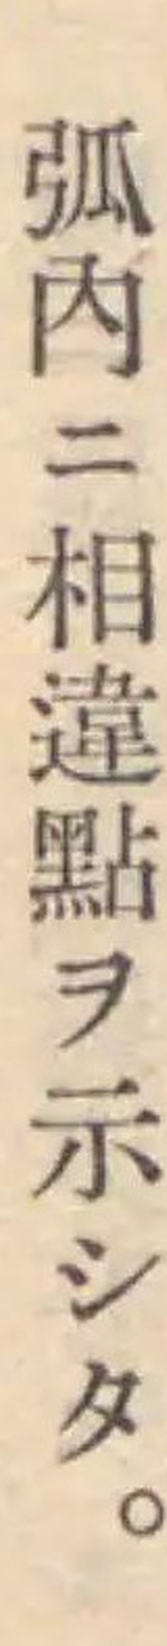弧内ニ相違点ヲ示シタ。
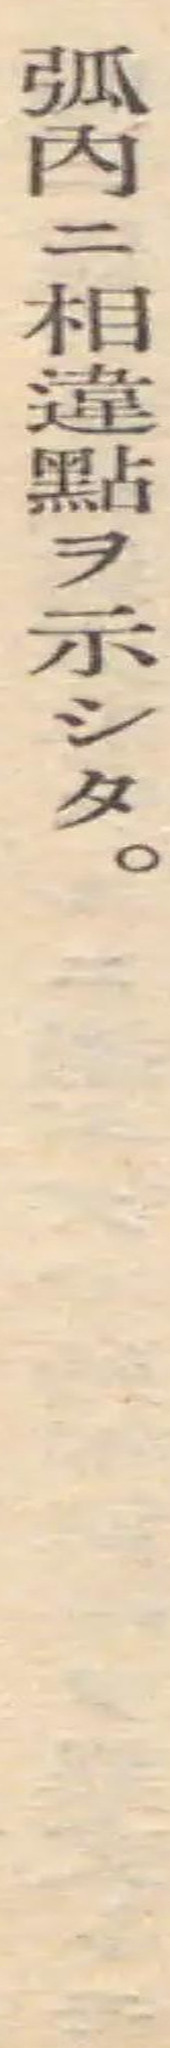弧内ニ相違点ヲ示シタ。
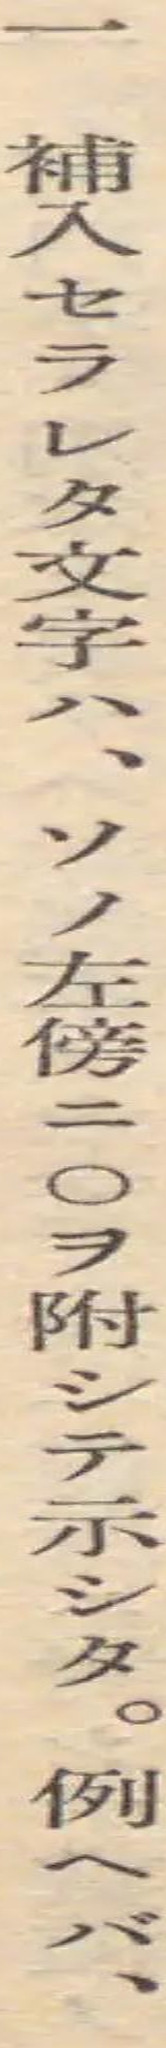一補入セラレタ文字ハ、ソノ左傍ニ○ヲ附シテ示シタ。例ヘバ、
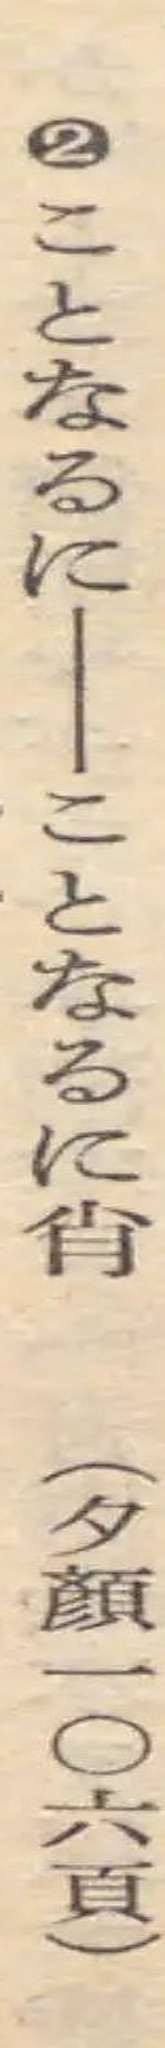➋ことなるに──ことなるに肖(夕顔一〇六頁)
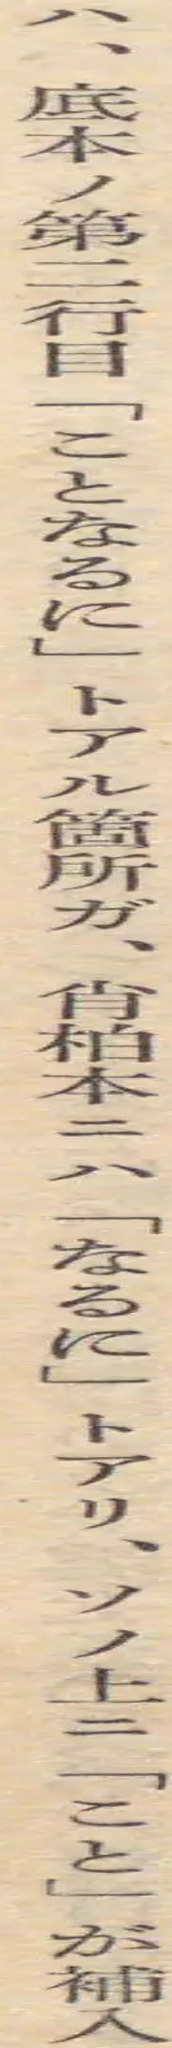ハ、庭本ノ第二行目「ことなるに」トアル箇所ガ、肖柏本ニハ「なるに」トアリ、ソノ上ニ「こと」が補入
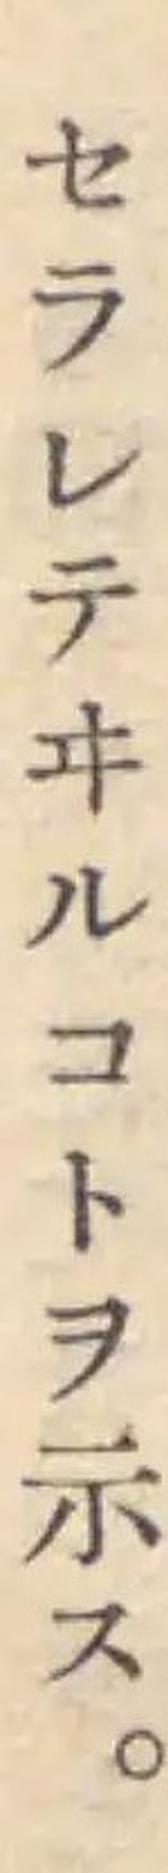セラレテヰルコトヲ示ス。
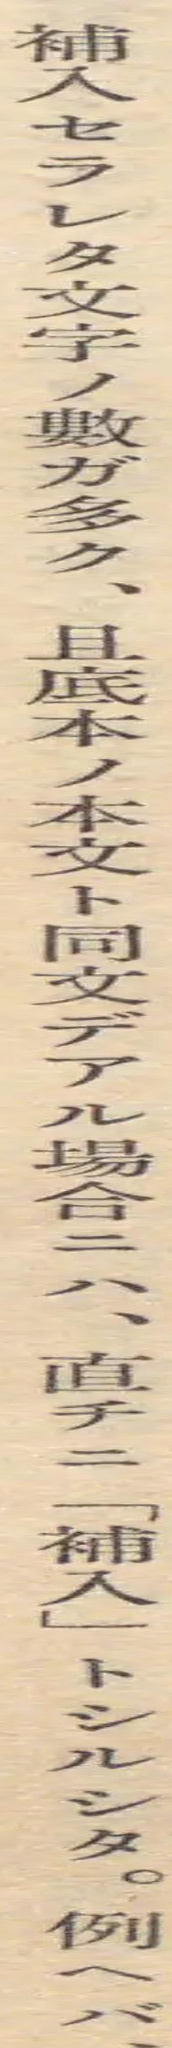補入セラレタ文字ノ数ガ多ク、且底本ノ本文ト同文デアル場合ニハ、直チニ「補入」トシルシタ。例ヘバ、
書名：校異源氏物語.
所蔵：国立国会図書館 National Diet Library, JAPAN
